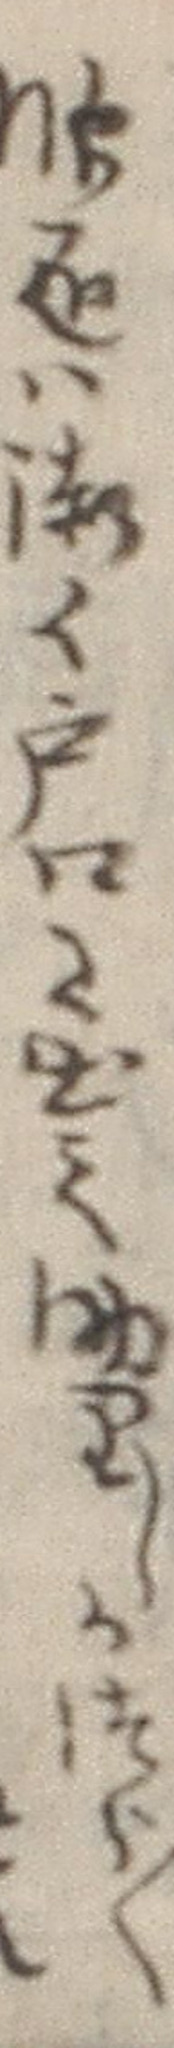師匠は漸く戸口に出て助りしかつく〳〵
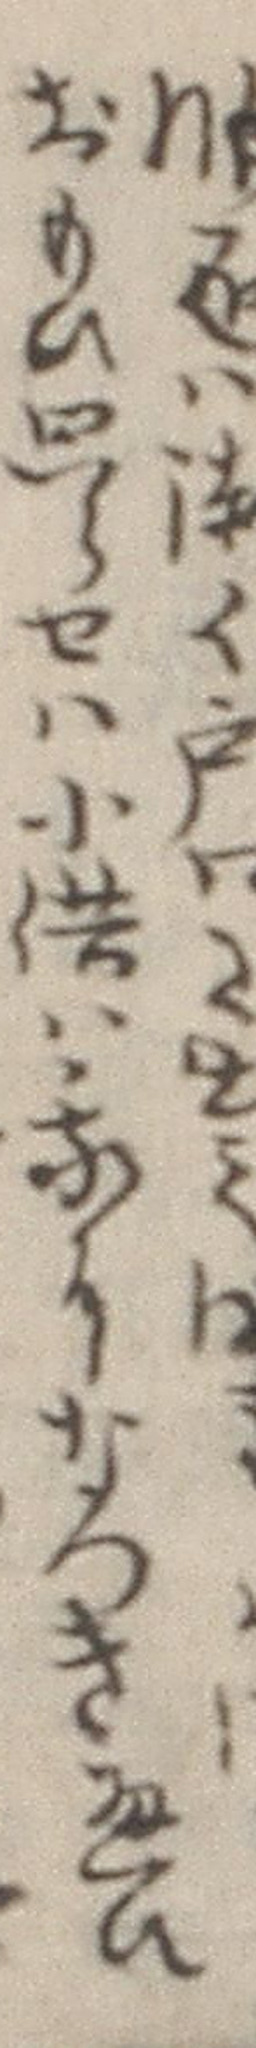おもひ廻らせは小供は我になつき通ひ
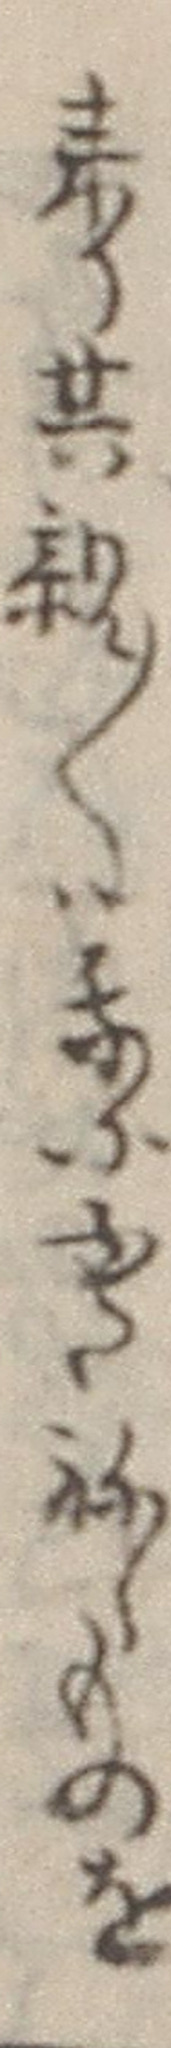来り其親〱は我にゆたねしものを
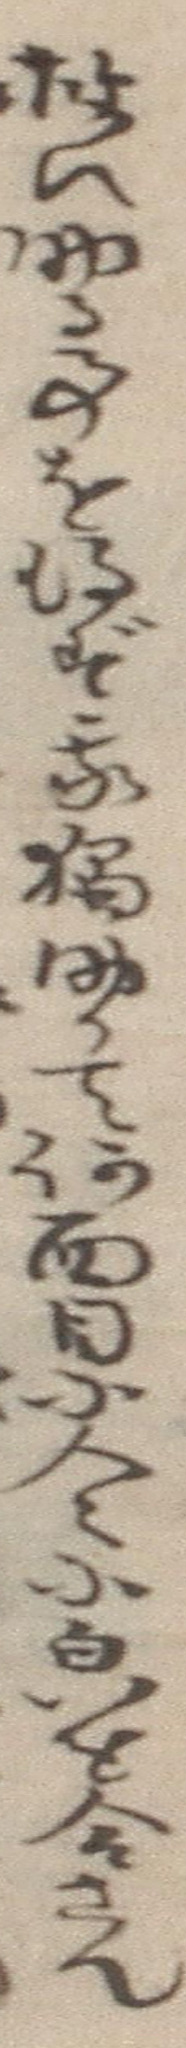救ひ助る事を得ず我獨助りて何面目に人々に貌を合さん
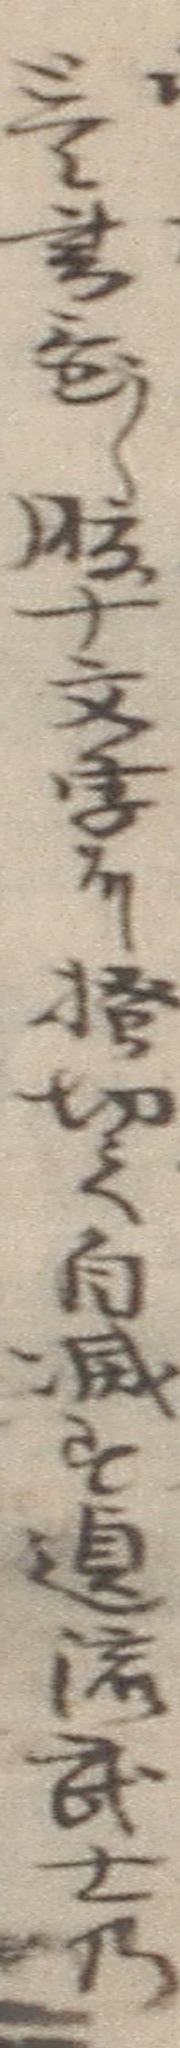とて書置し腹十文字に搔切て自滅す遉流武士の
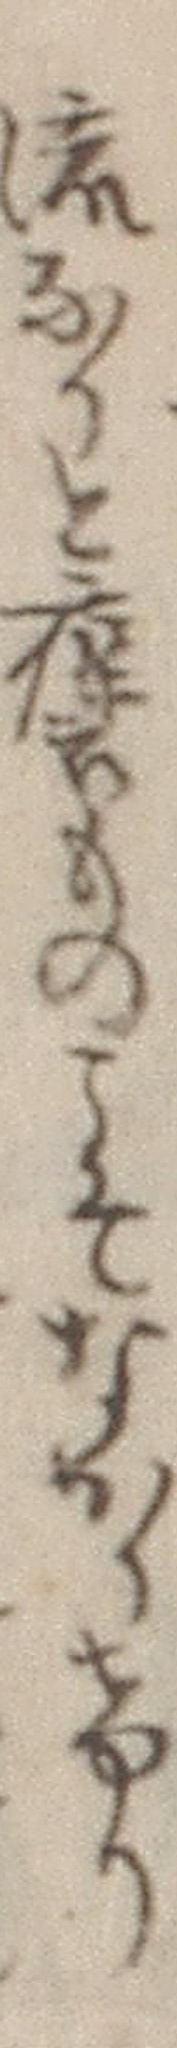流なりと褒ものこそなかりけり
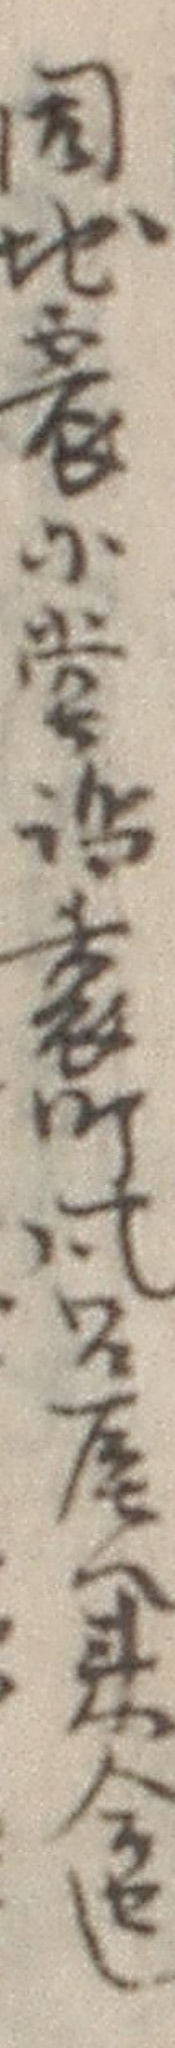同地震に堂嶋裏町風呂屋へ来合せし
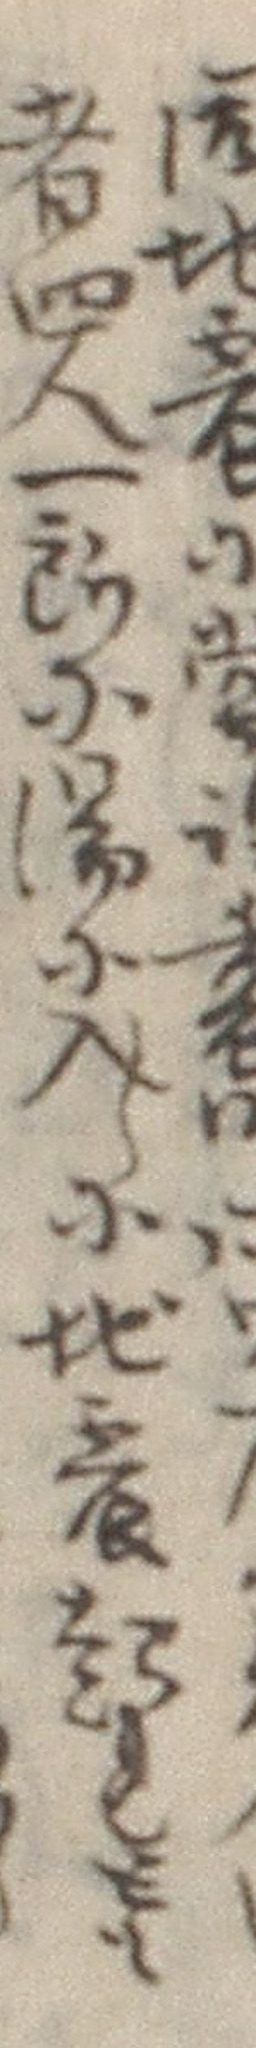者四人一所に湯に入しに地震起れとも
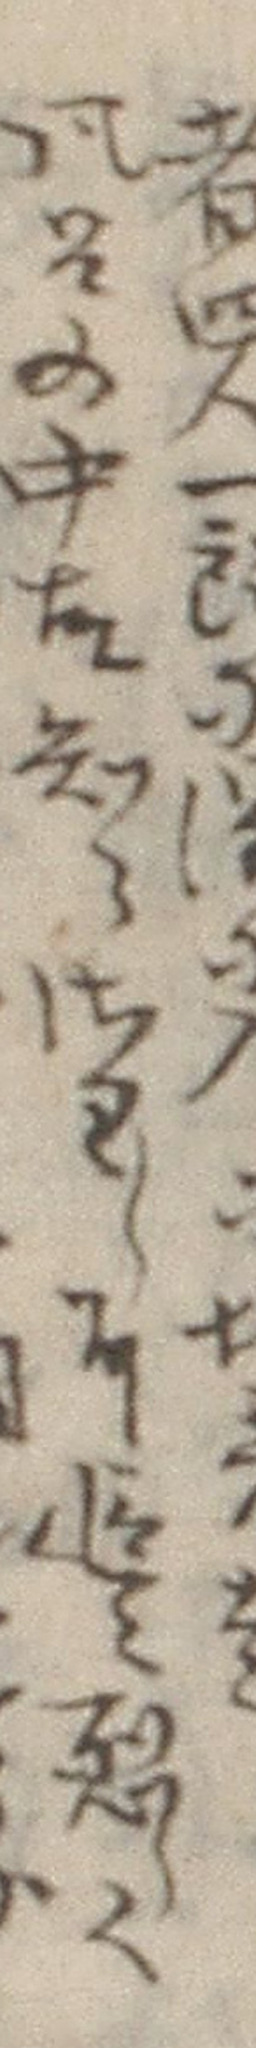風呂の中故知らさりしに追々烈しく
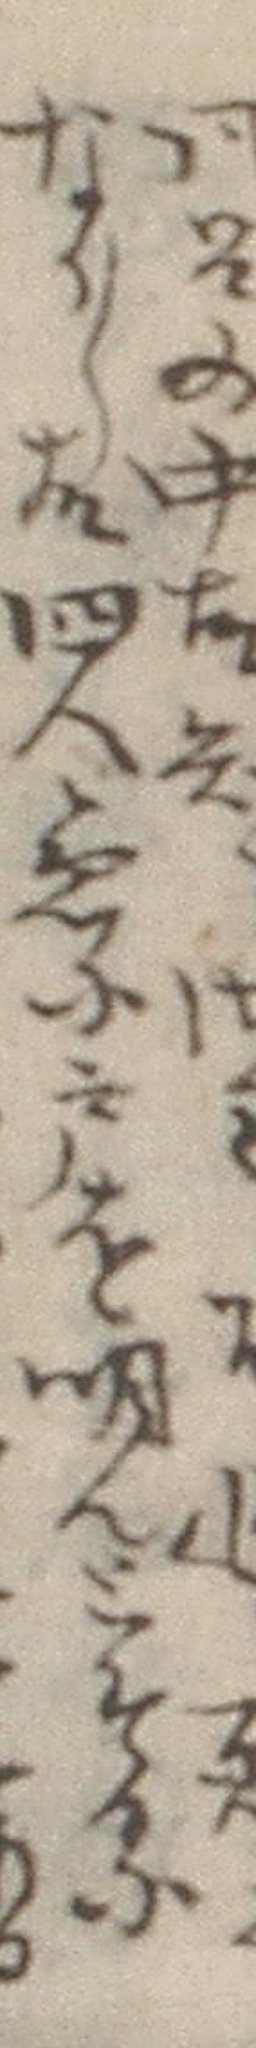なりし故四人急に戸を明んとするに
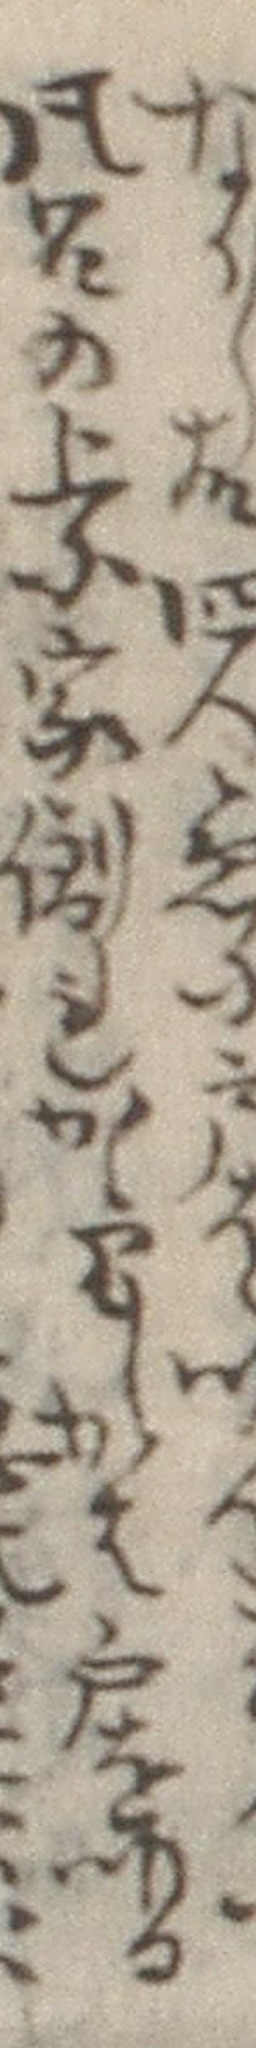風呂の上に家倒れかゝりしかは戸を明る
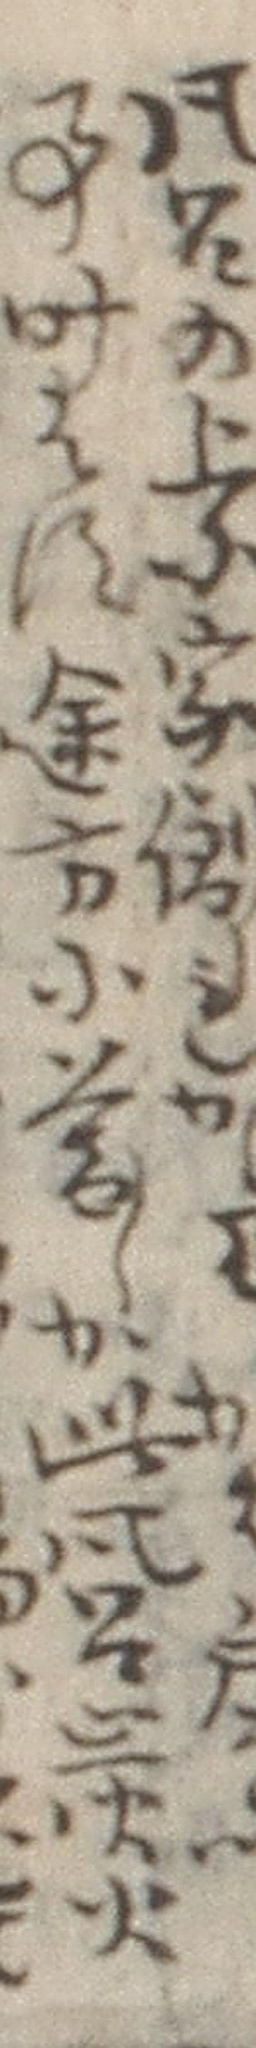事叶はす途方に暮しか此風呂炭火
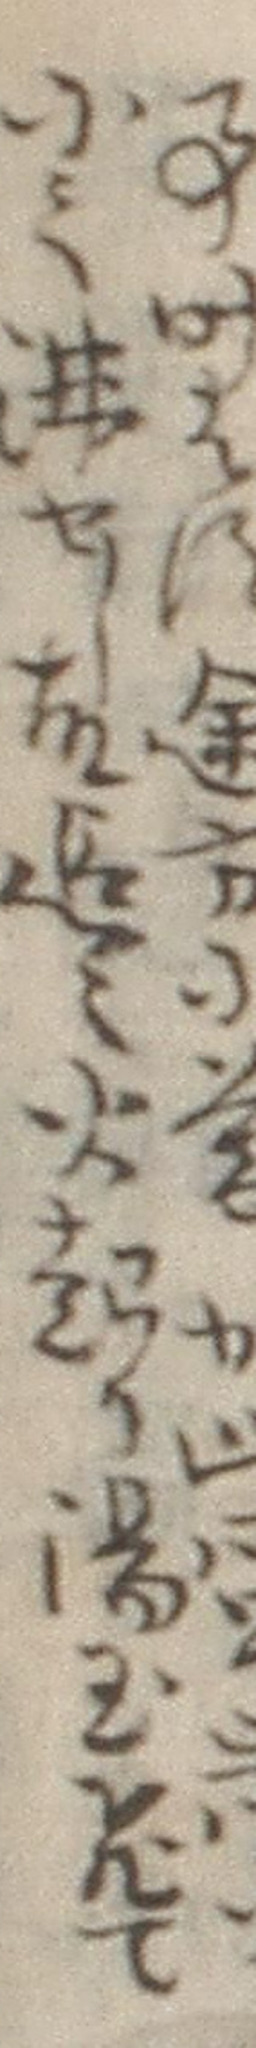にて沸せし故追々火起り湯玉飛て
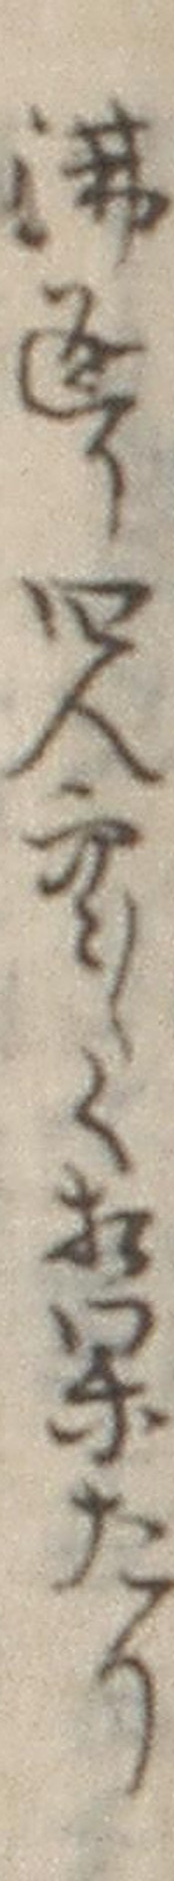沸返り四人空しく相果たり

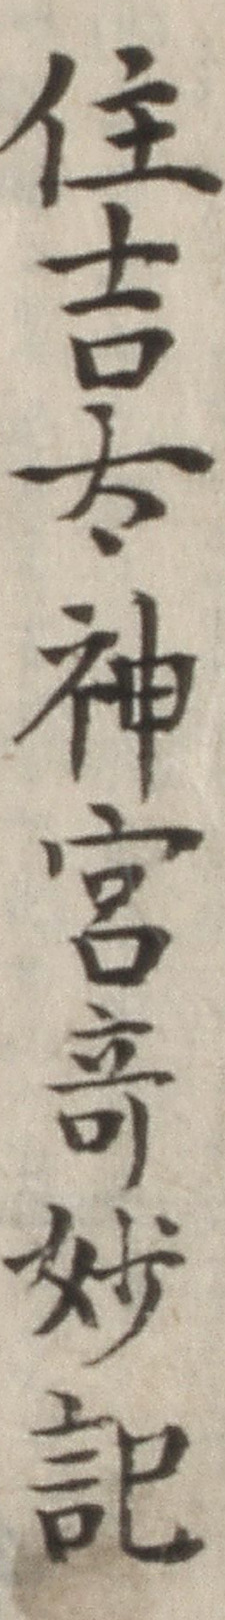住吉太神宮奇妙記
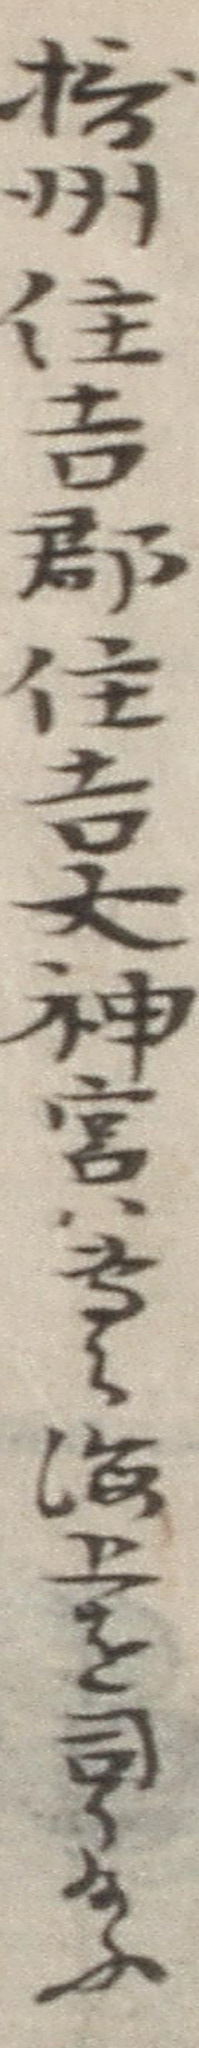摂州住吉郡住吉大神宮は専ら海上を司り給ふ
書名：諸國大地震年代記末代噺種
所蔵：東京大学地震研究所図書室 Earthquake Research Institute Library, The University of Tokyo, JAPAN
